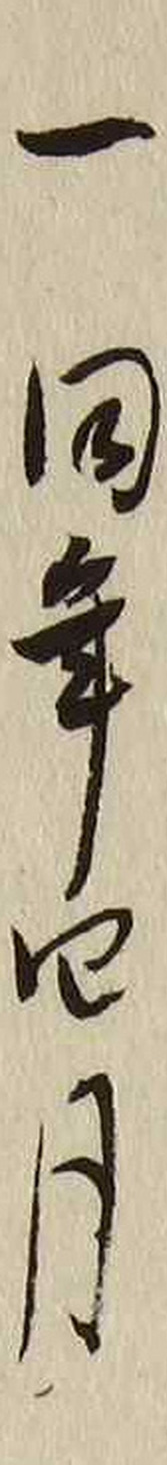一同年四月
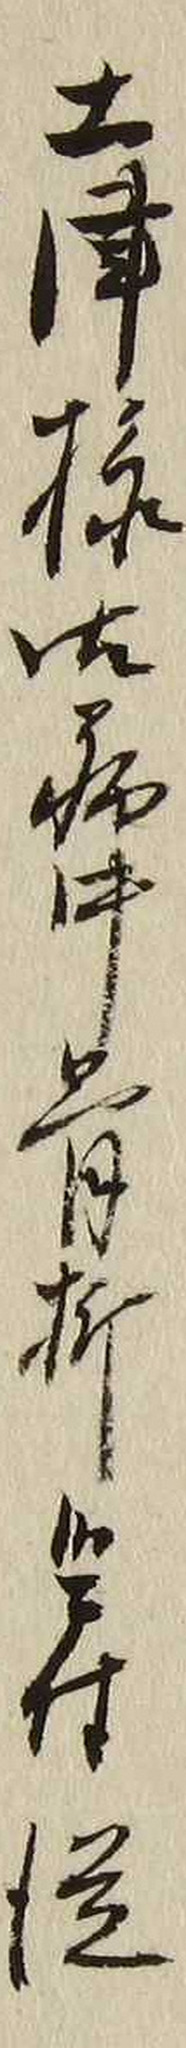土津様御病中骨折候ニ付従
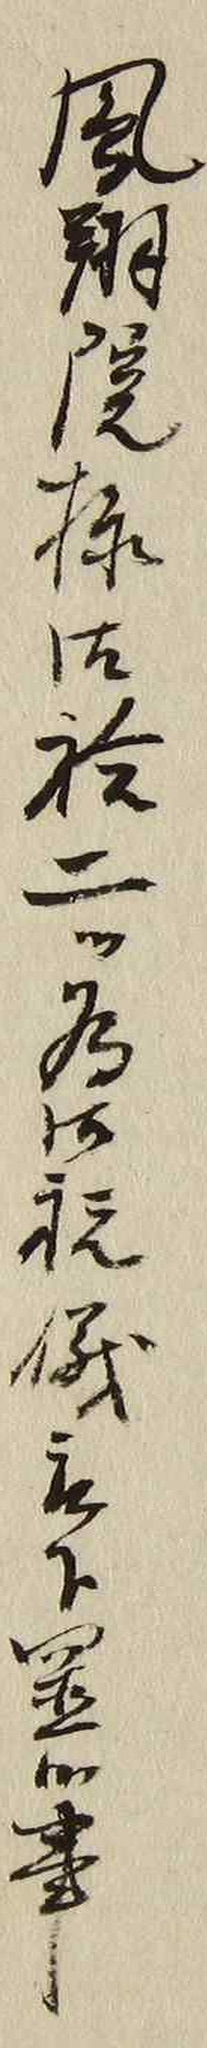鳳翔院様御袷二ツ為御祝儀被下置候事
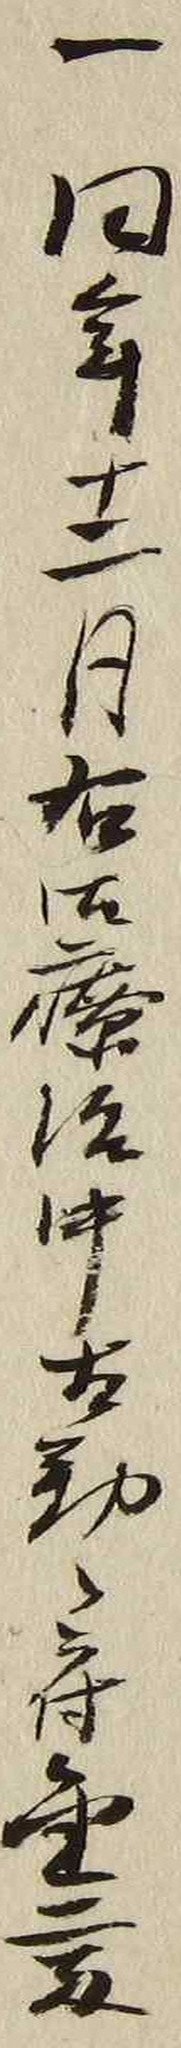一同年十二月右御療治中相勤候ニ付金二両
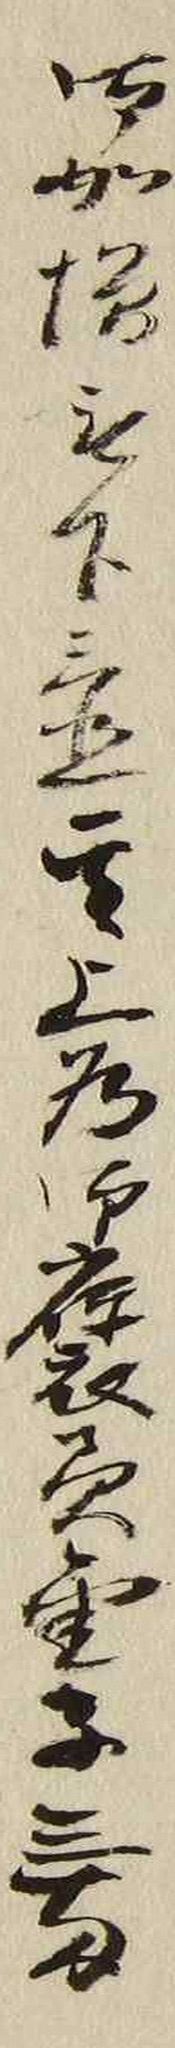御加増被下置其上為御褒美金子三両
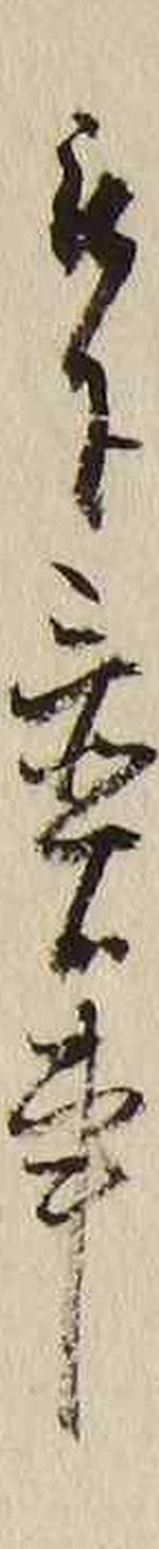被下置候事

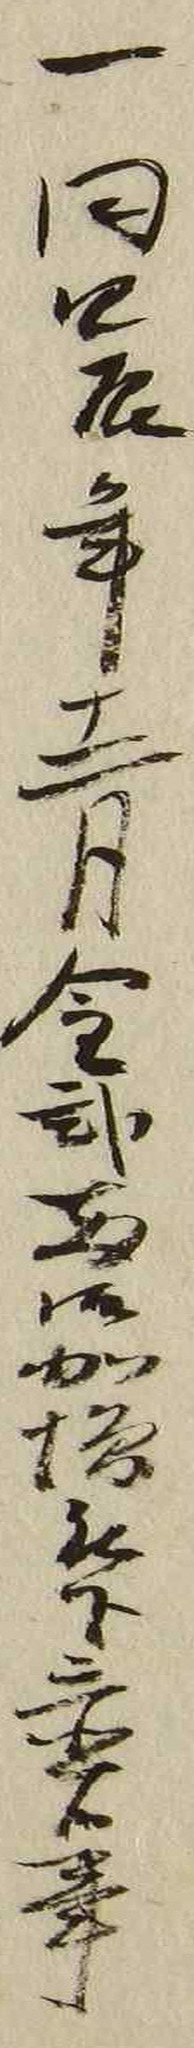一同四辰年二月金弐両御加増被下置候事
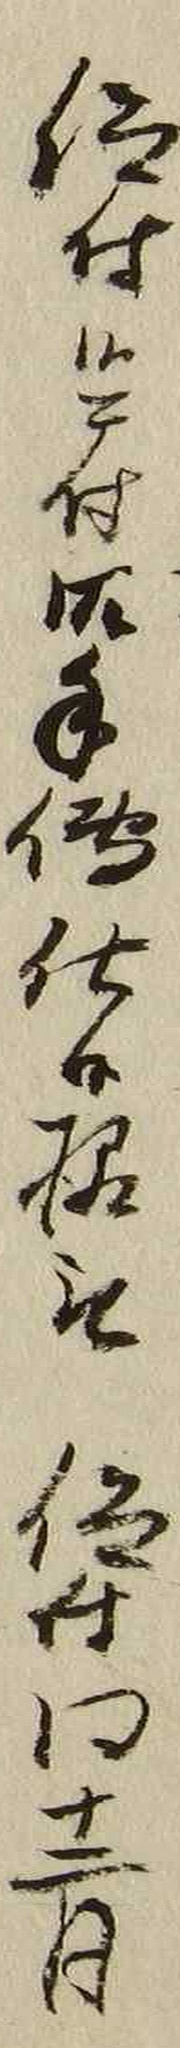仰付候ニ付御手伝仕候様被仰付同十二月
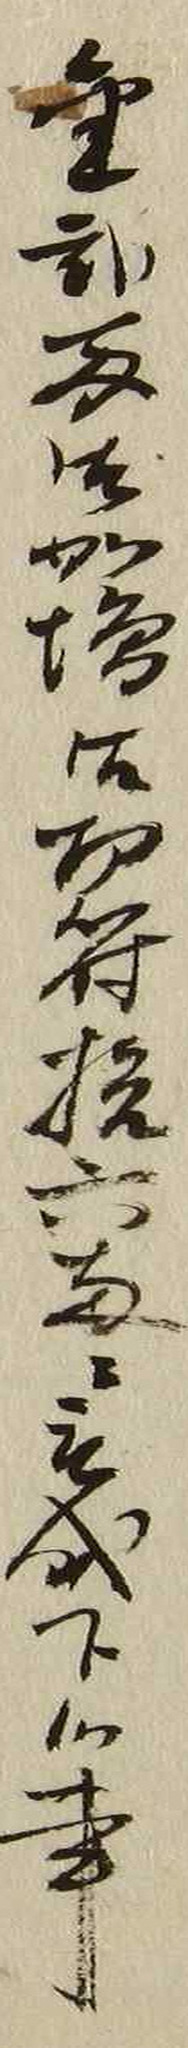金弐両御加増御切符拾六両ニ被成下候事
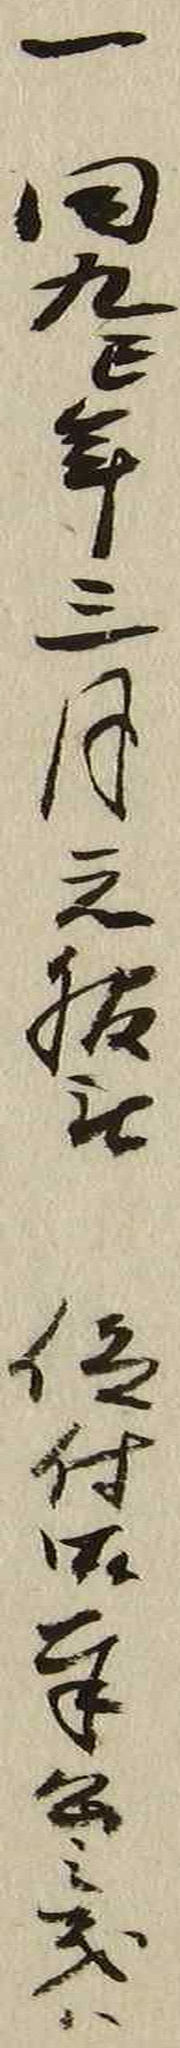一同九巳年三月元服被仰付御奉公之義ハ
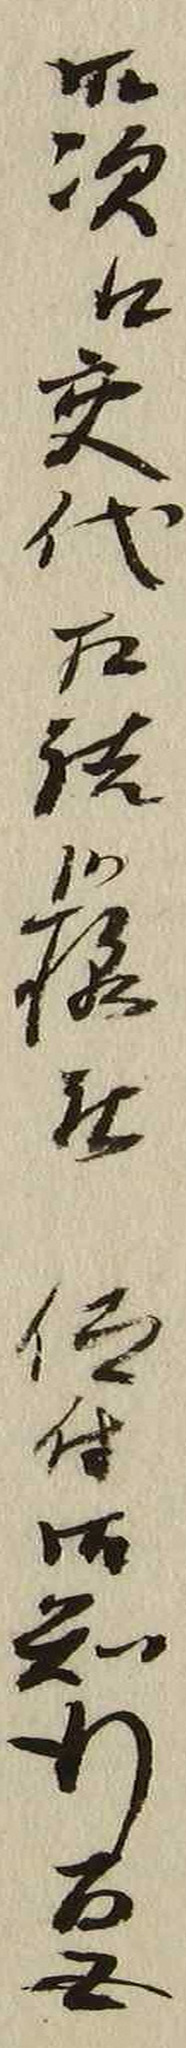御次江交代相詰候様被仰付御知行百五
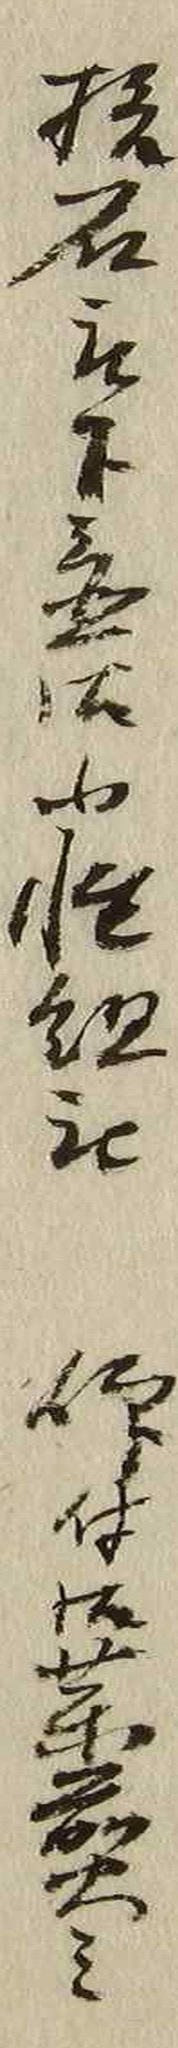拾石被下置御小性組被仰付御薬煎之
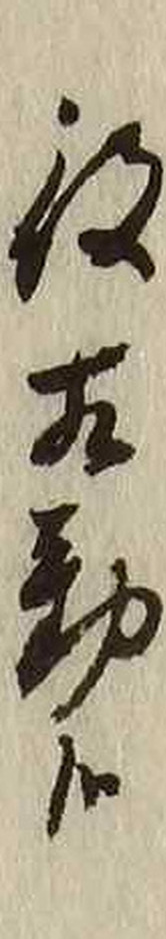役相勤候
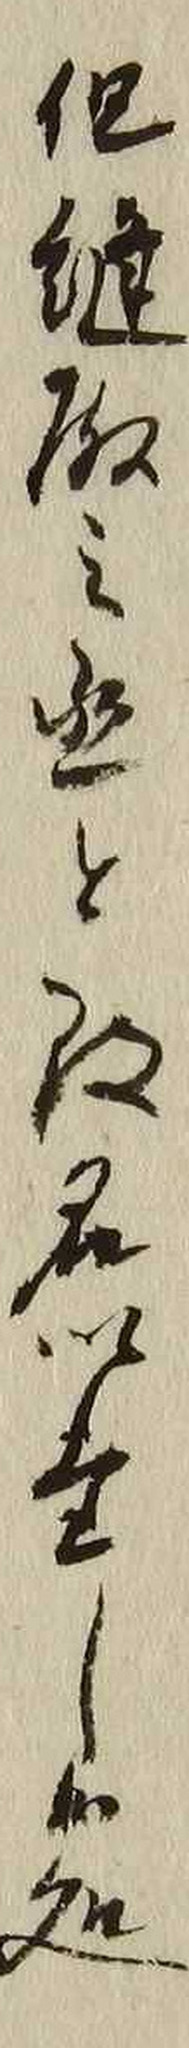但縫殿之丞と改名いたし候処
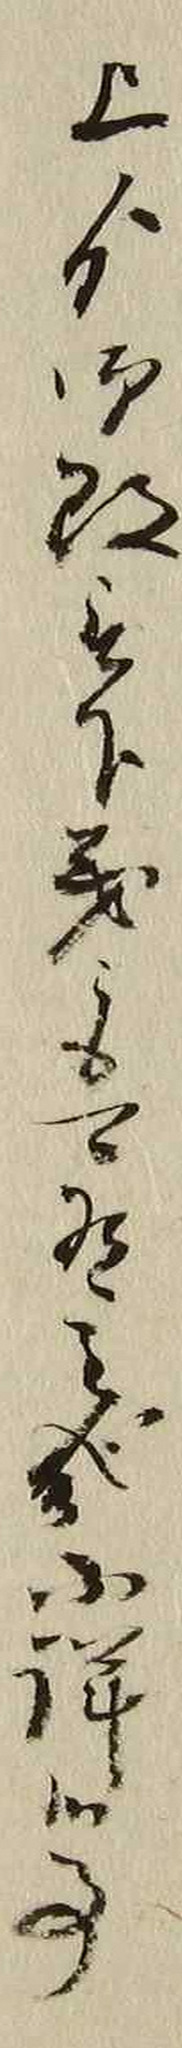上ゟ御改被下義ニも可有之哉不詳候事
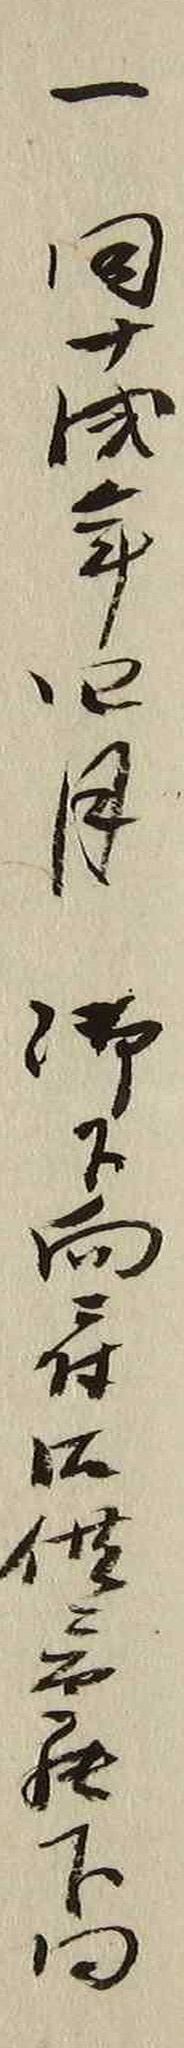一同十戌年四月御下向ニ付御供ニ而罷下同
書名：諸士系譜　巻之345　も之部1
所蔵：会津若松市立会津図書館
